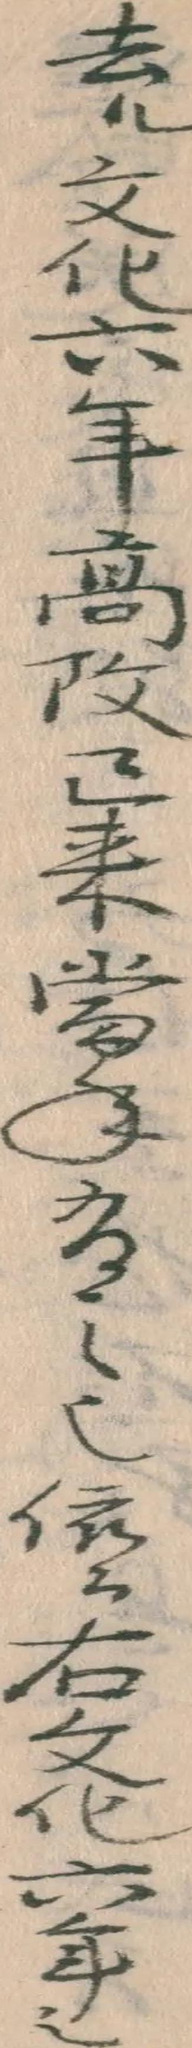去ル文化六年高改已来當年有之也依而右文化九年之
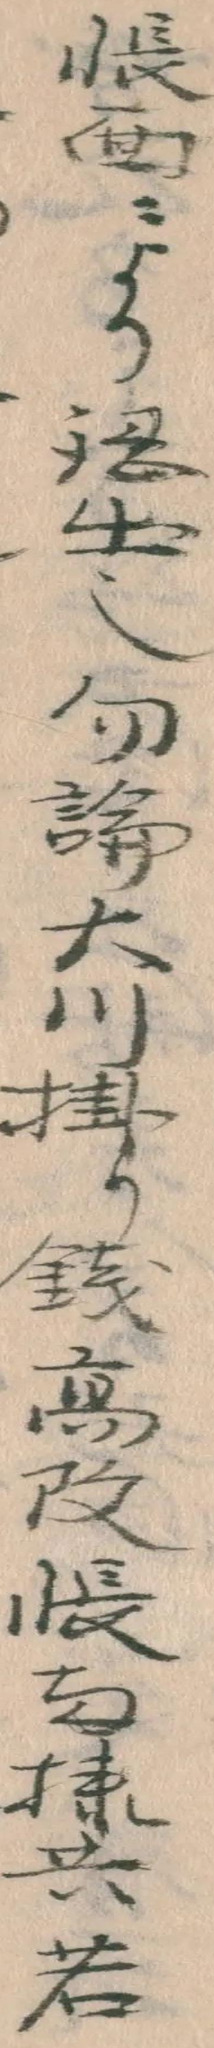帳面ニより認出也勿論大川掛リ銭高改帳面様共若
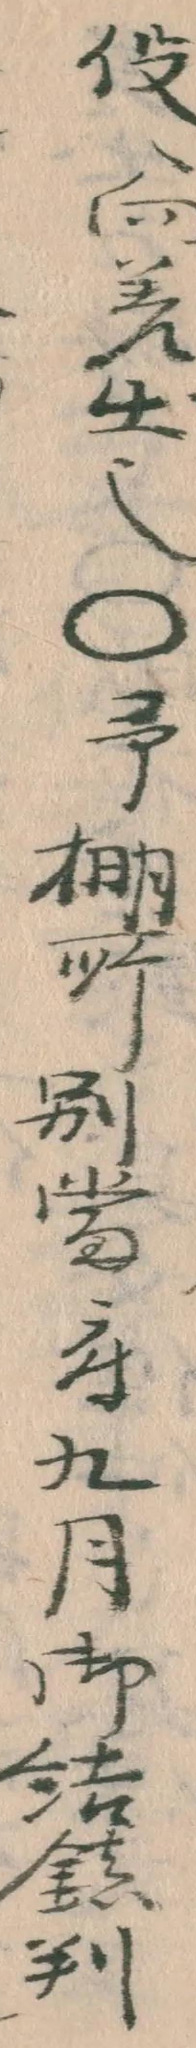役へ向差出也○予棚所別當ニ付九月御結鎮判
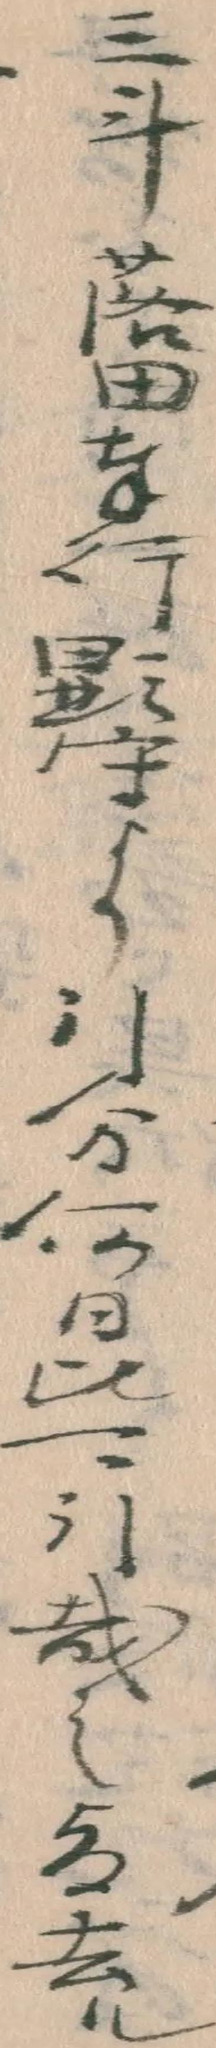三斗落田奉行顕守より引分何日比可引哉之旨去ル
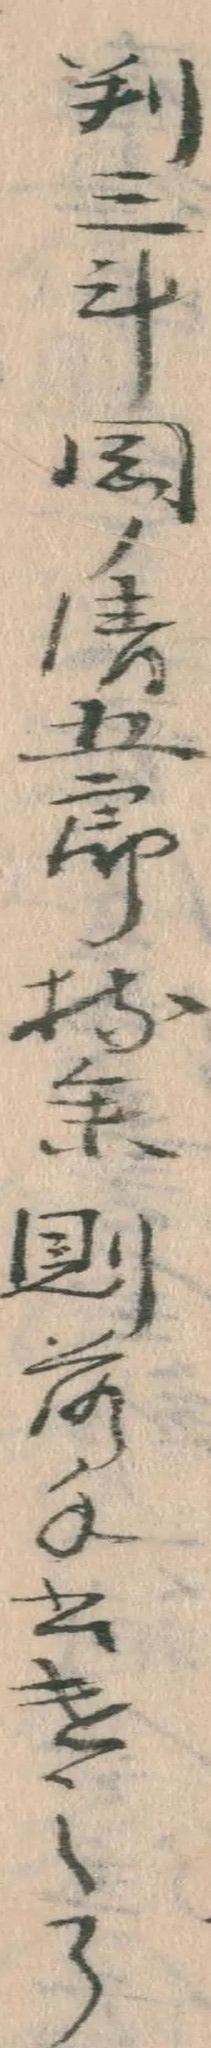判三斗岡ノ清五郎持参則落手書遣之了
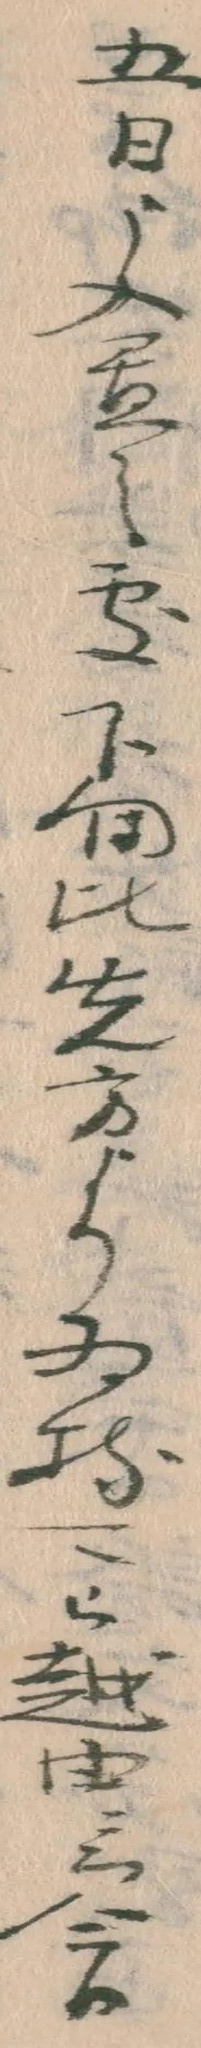五日被入置候處下旬頃先方より為持可被越由ニ而今日
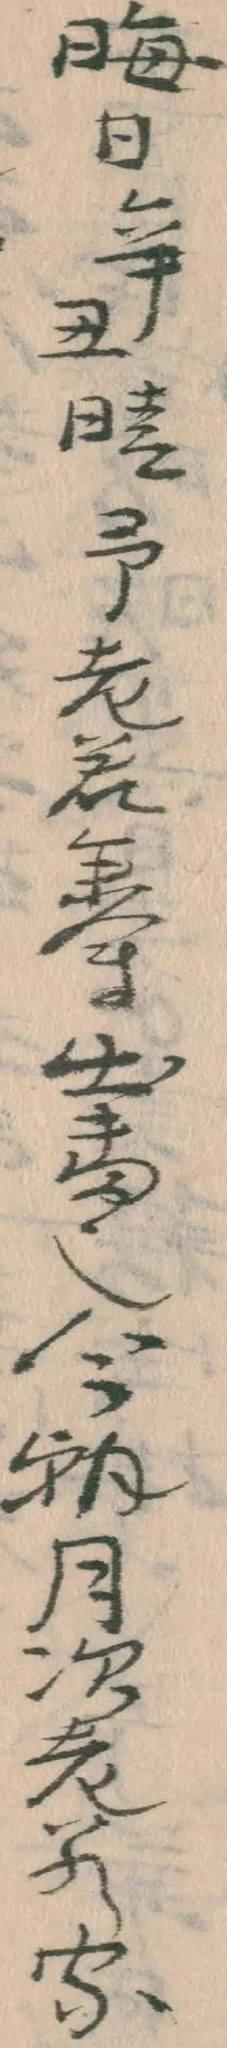晦日辛丑晴予老若参會出番也今朝月次老若家
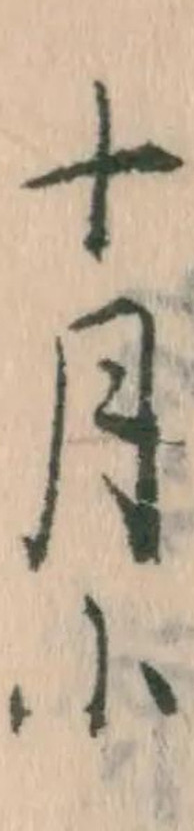十月小
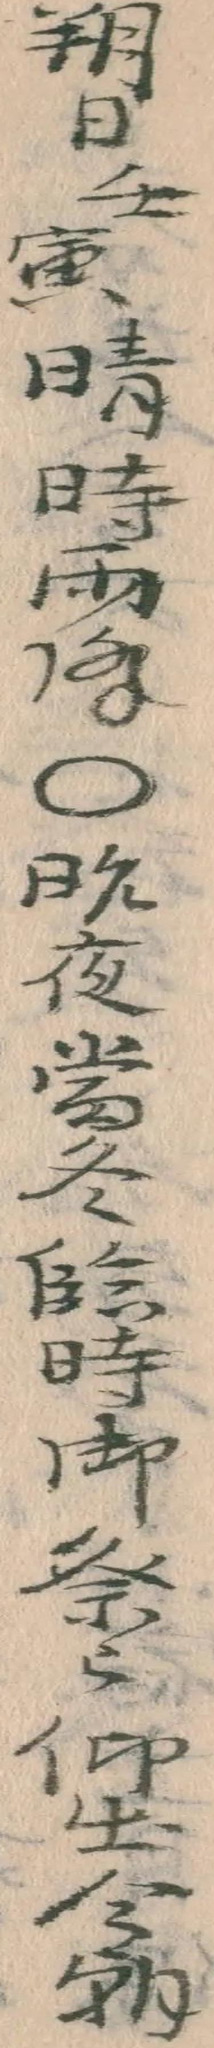朔日壬寅晴時雨降○昨夜當冬臨時御祭被仰出今朝
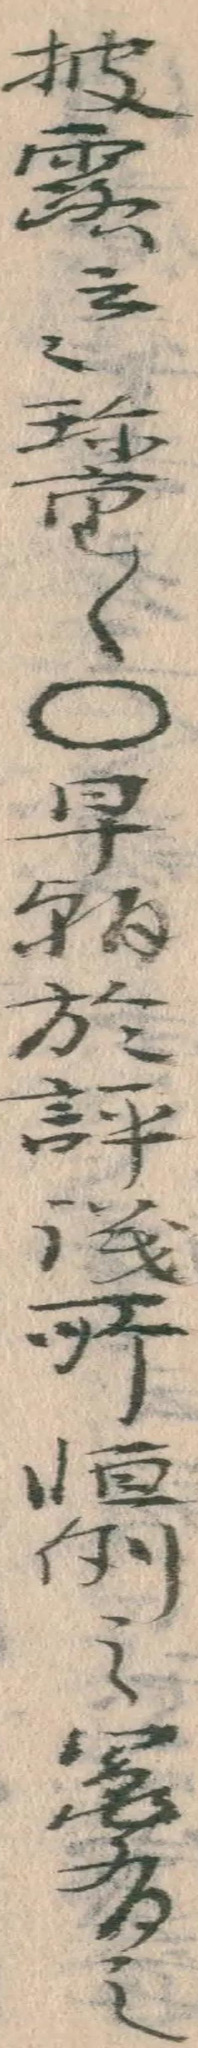披露云〻珍重〳〵○早朝於評議所恒例之鬮有之
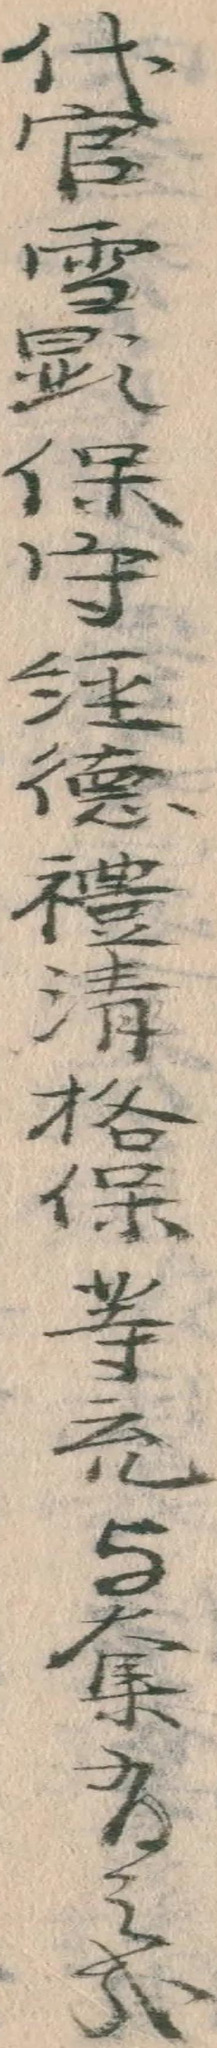代官雪顕保守経徳禮清格保等充与奪有之哉
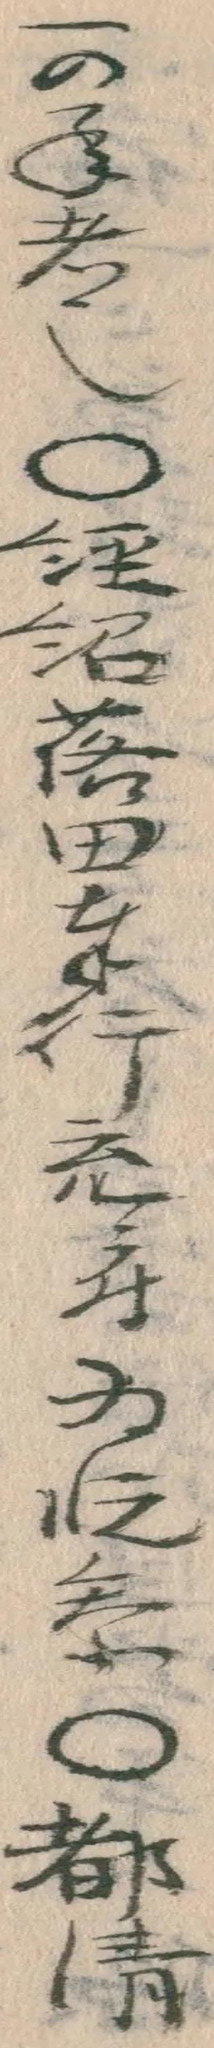可承者也○経沼落田奉行充ニ付為祝参○都清
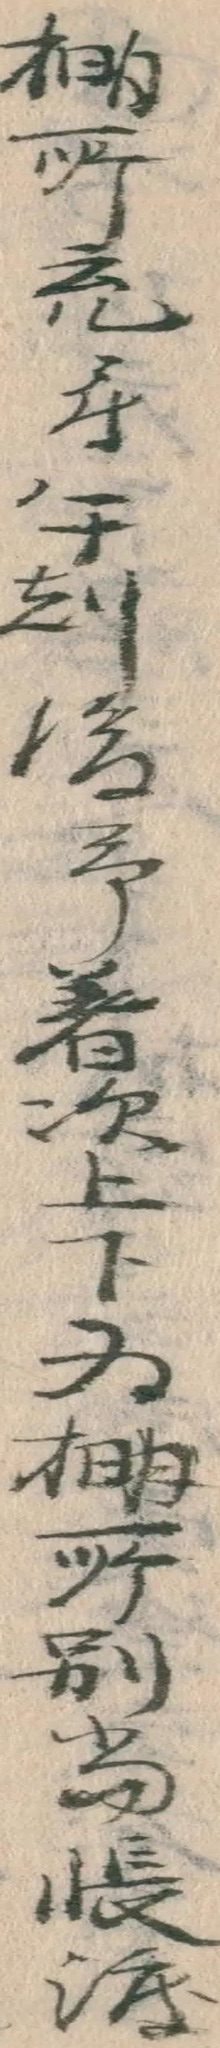棚所充ニ付午刻後予着次上下為棚所別當帳渡
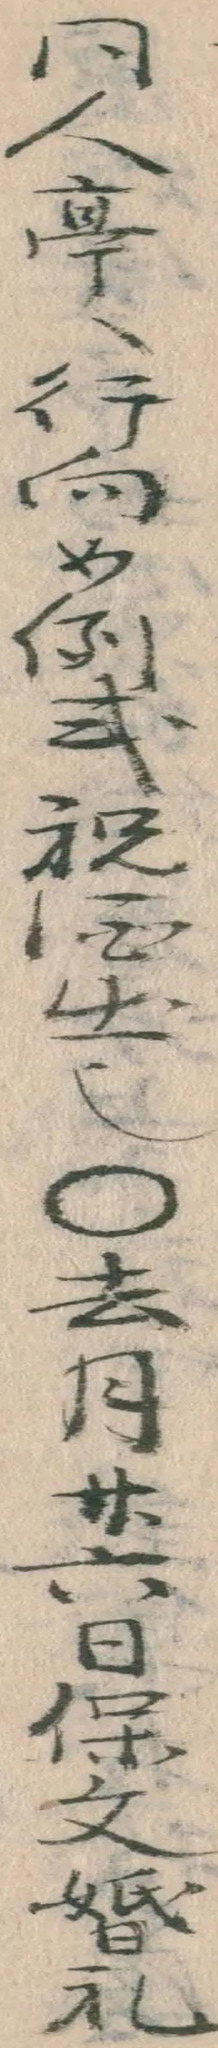同人亭へ行向如例式祝酒出也○去月廿六日保文婚礼
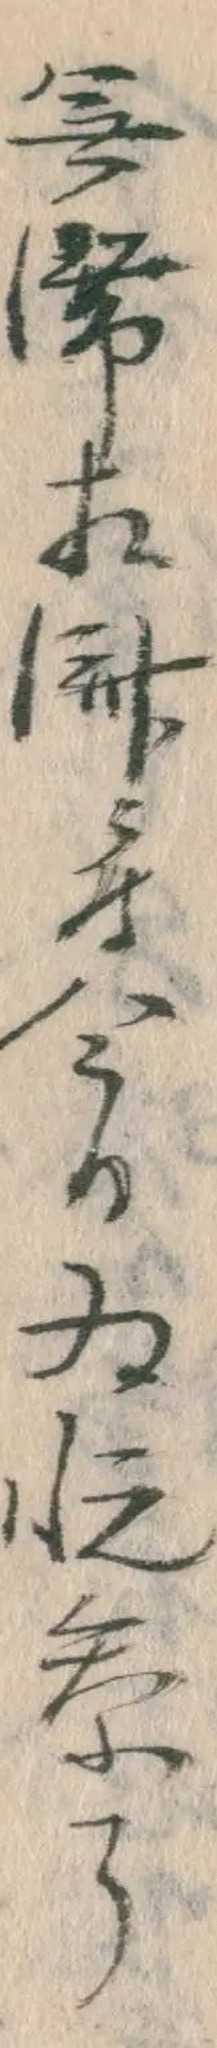無滞相済に付今日為渡参了
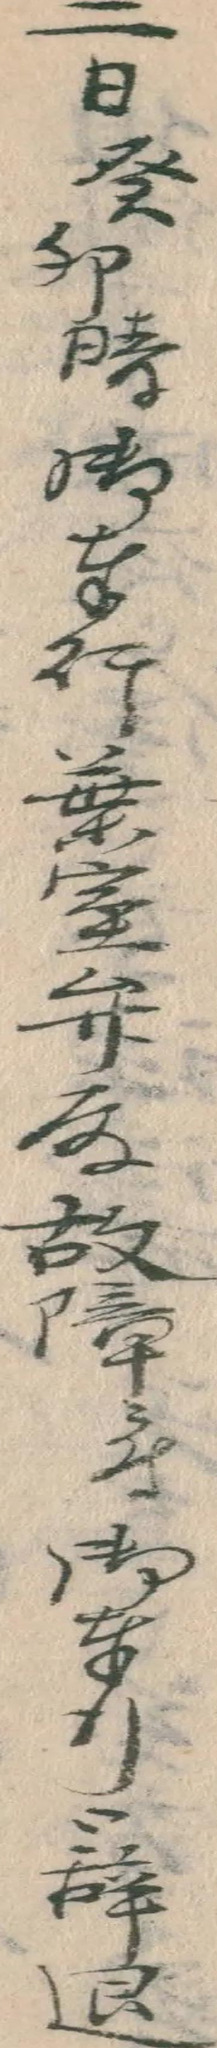二日癸卯晴御奉行葉室弁殿故障ニ付御奉引御辞退
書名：賀茂社記録. 第63冊
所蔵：国立国会図書館 National Diet Library, JAPAN
